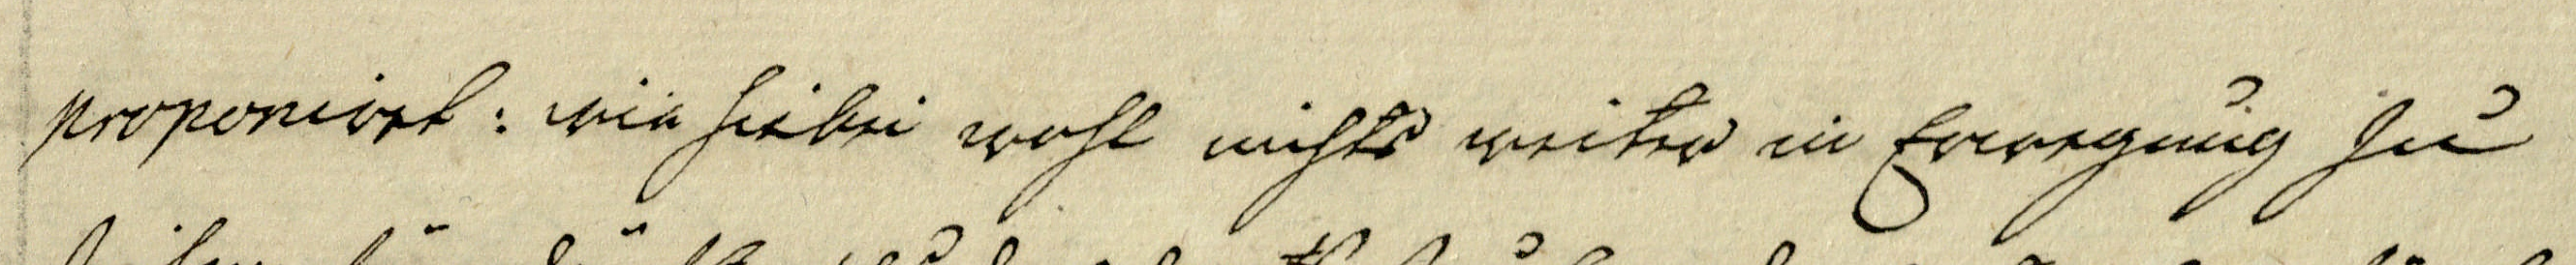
proponiret: wie hiebei wohl nichts weiter in Erwegung zu
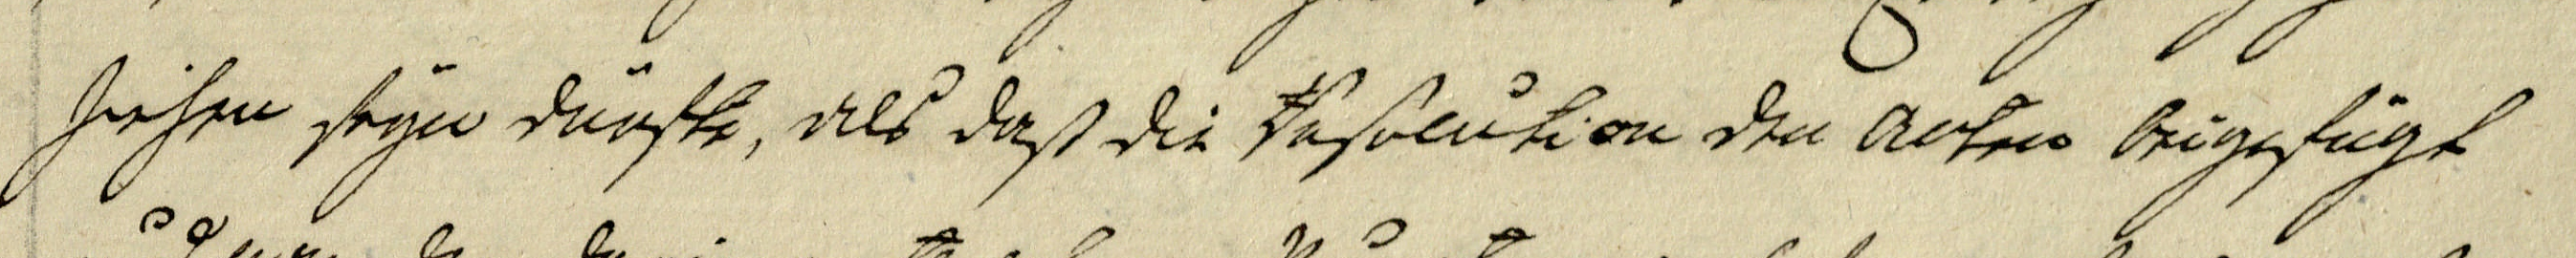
ziehen seÿn dürfte, als daß die Resolution den Acten beigefügt
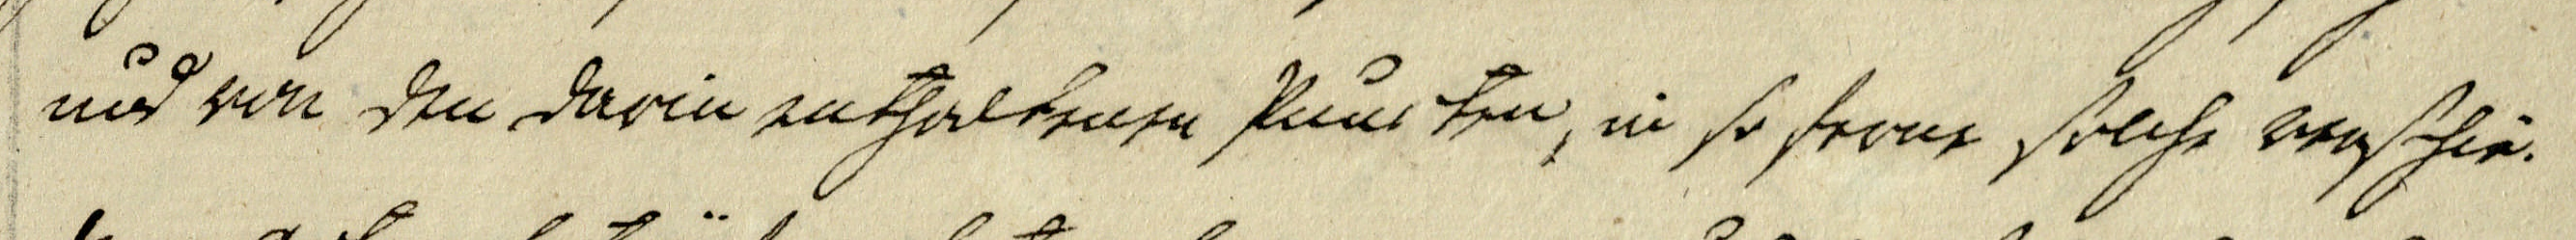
und von den darin enthaltenen Puncten, in so ferne solche verschie¬
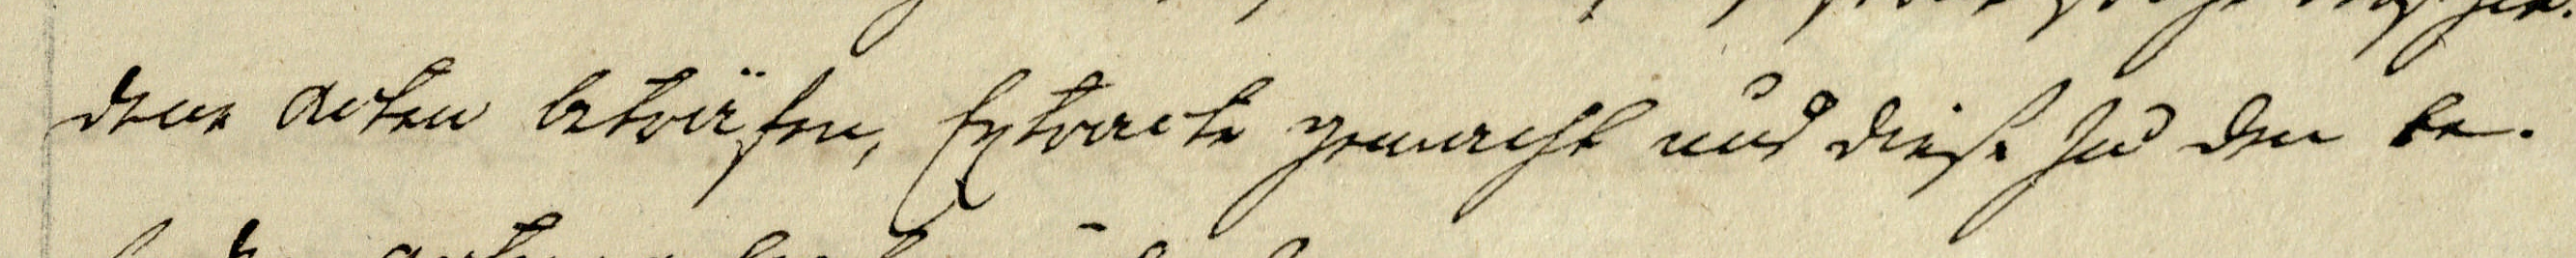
dene Acten beträfen, Extracte gemacht und diese zu den be¬
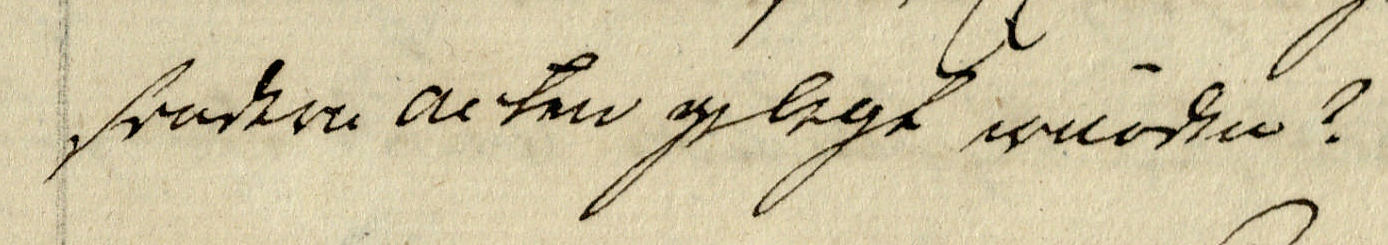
sondern Acten gelegt würden?
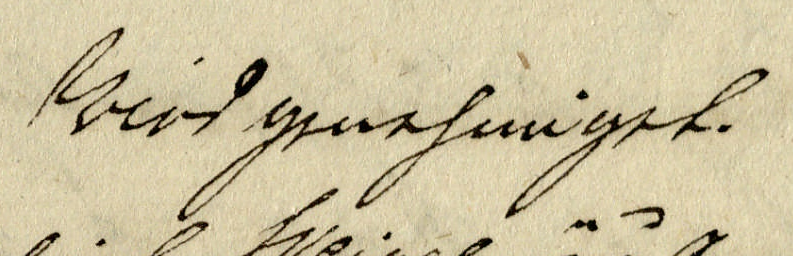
Wird genehmiget.
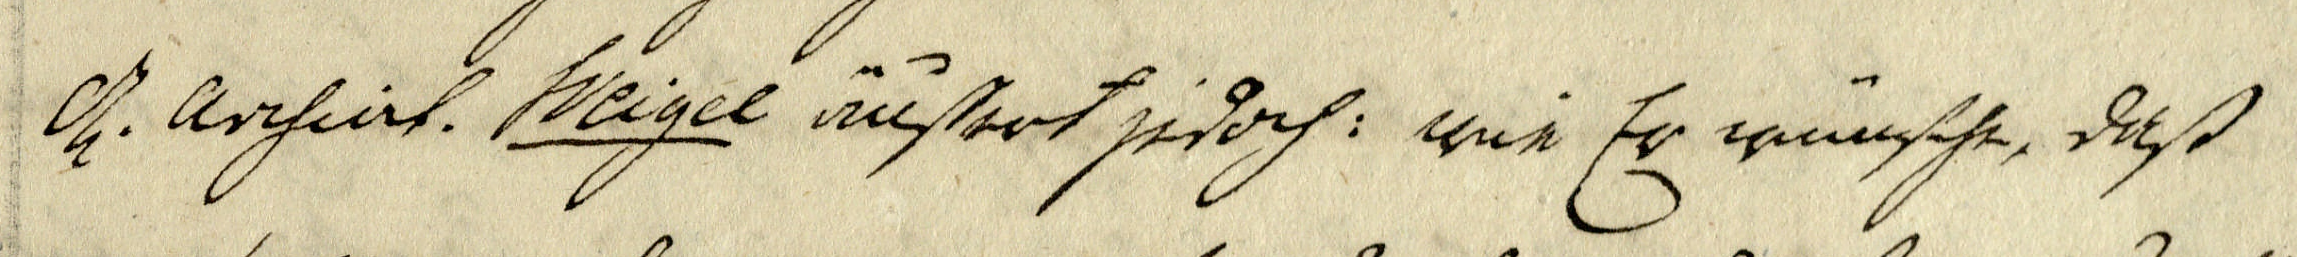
dh. Archiat. Weigel äussert jedoch: wie Er wünsche, daß
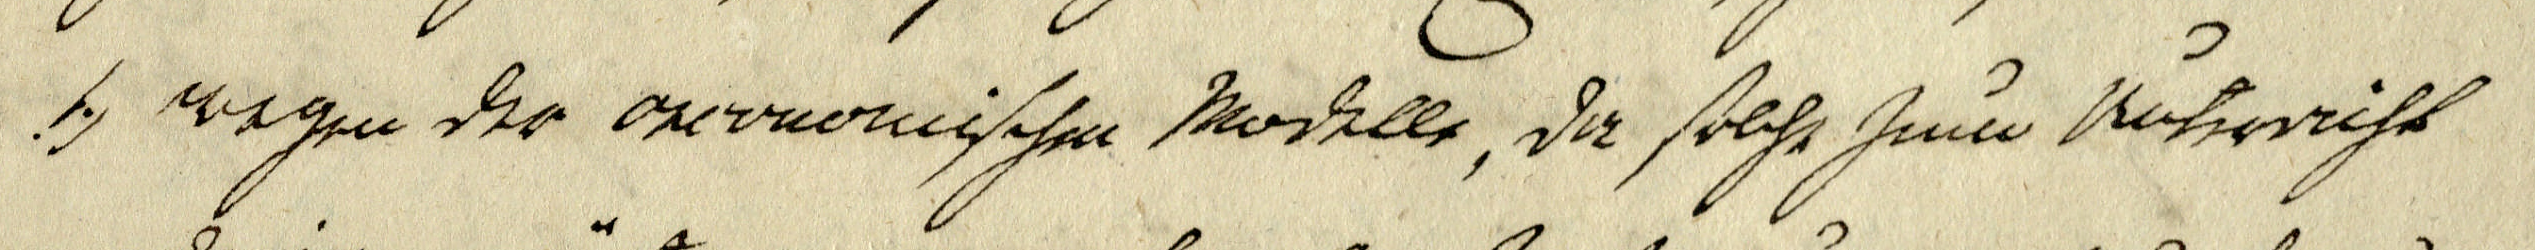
1., wegen der oeconomischen Modelle, da solche zum Unterricht
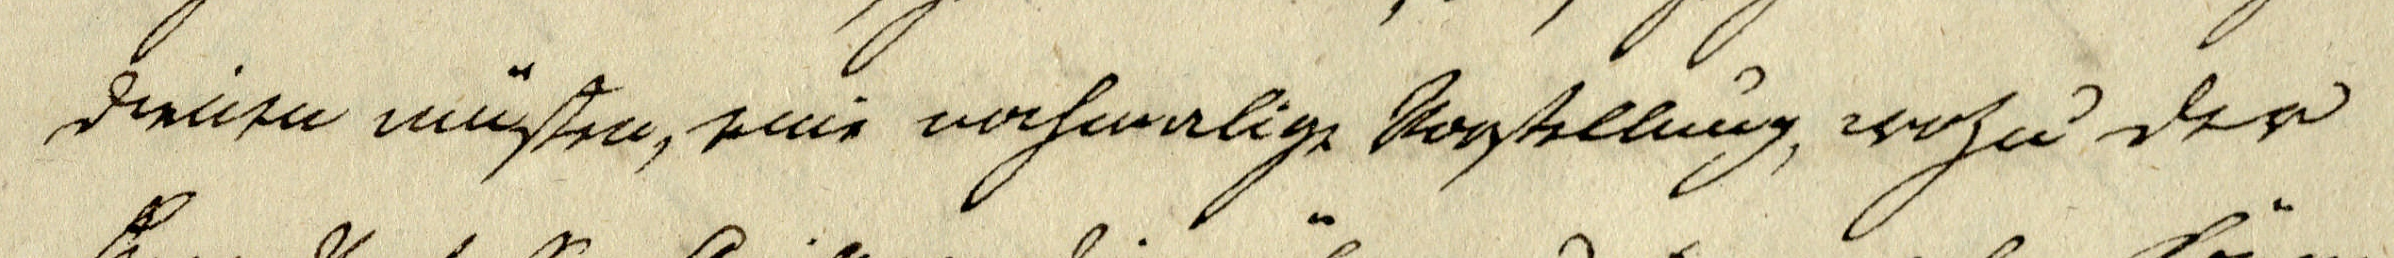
dienen müsten, eine nochmalige Vorstellung, wozu der
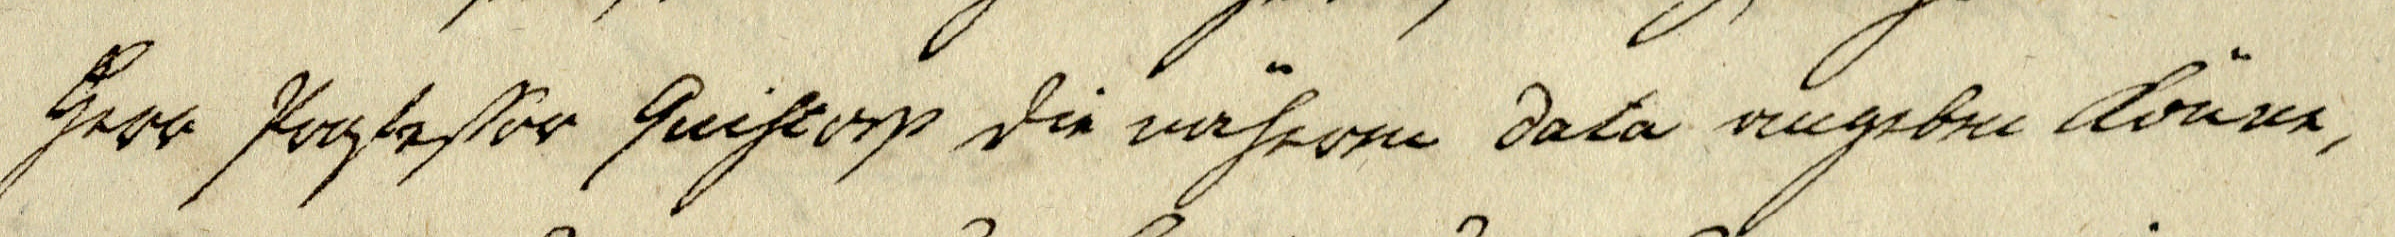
Herr Professor Quistorp die näheren data angeben könne,
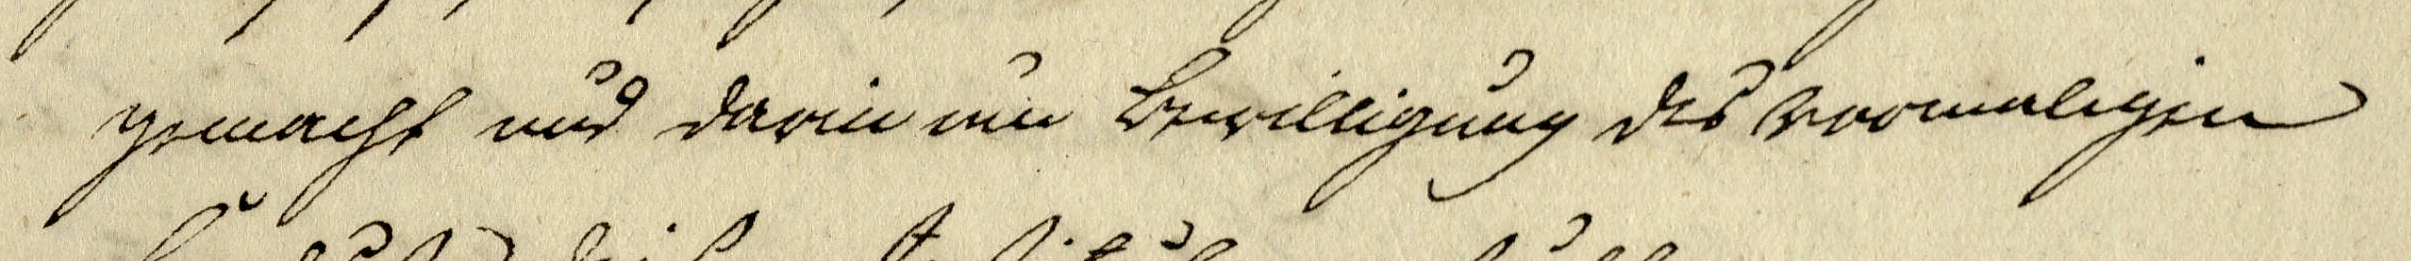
gemacht und darin um Bewilligung des vormaligen
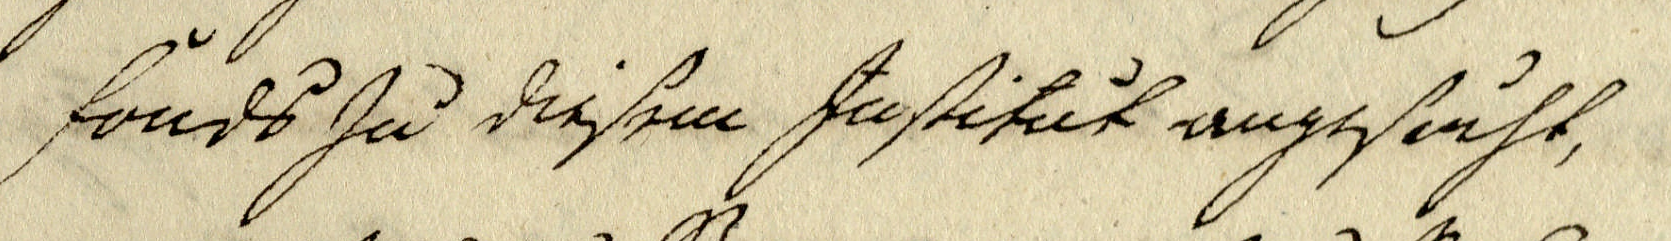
Fonds zu diesem Institut angesucht,
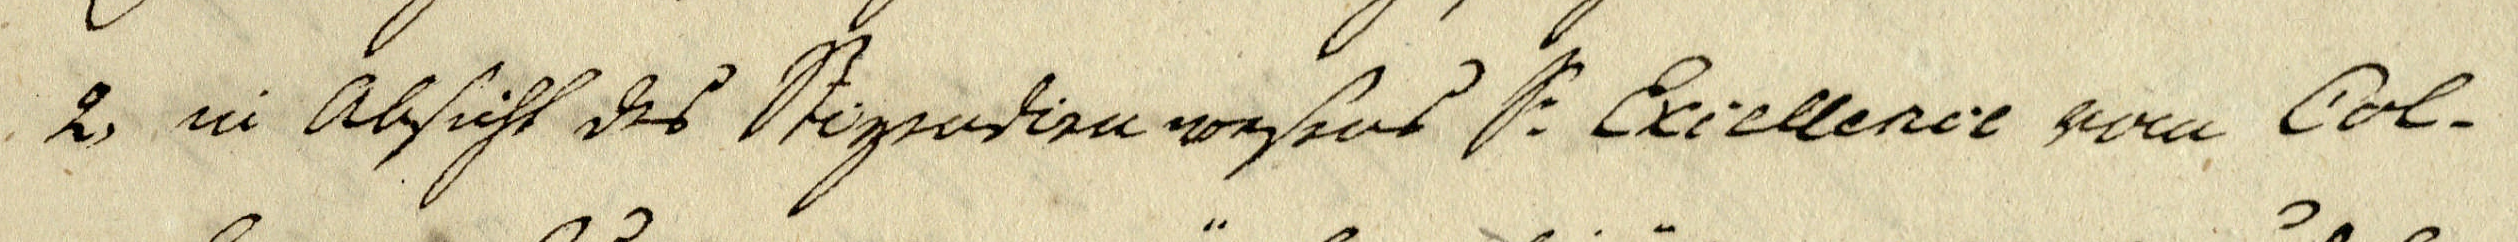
2, in Absicht des Stipendienwesens S. Excellence vom Col¬
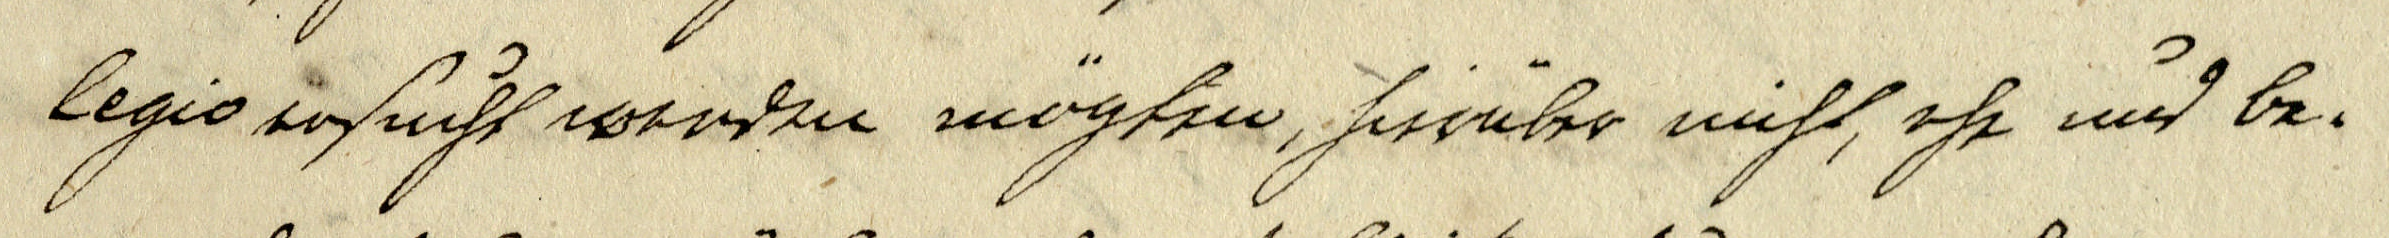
legio ersucht werden mögten, hierüber nicht, ehe und be¬
